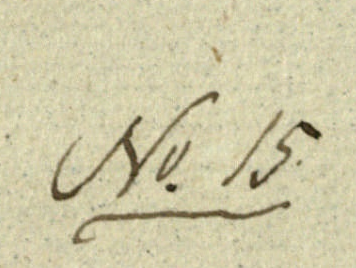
No 15.
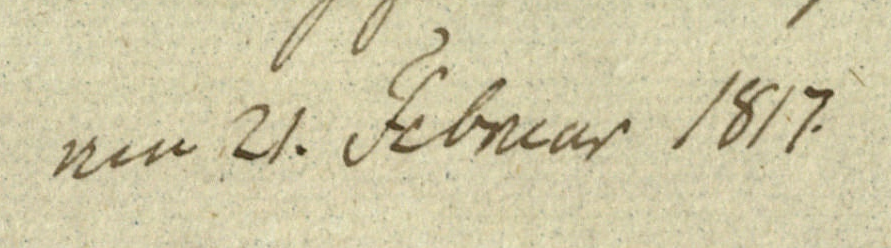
am 21. Februar 1817.
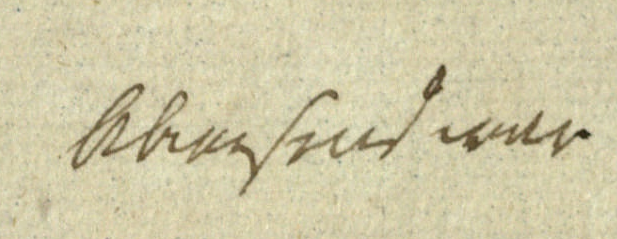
Abwesend war
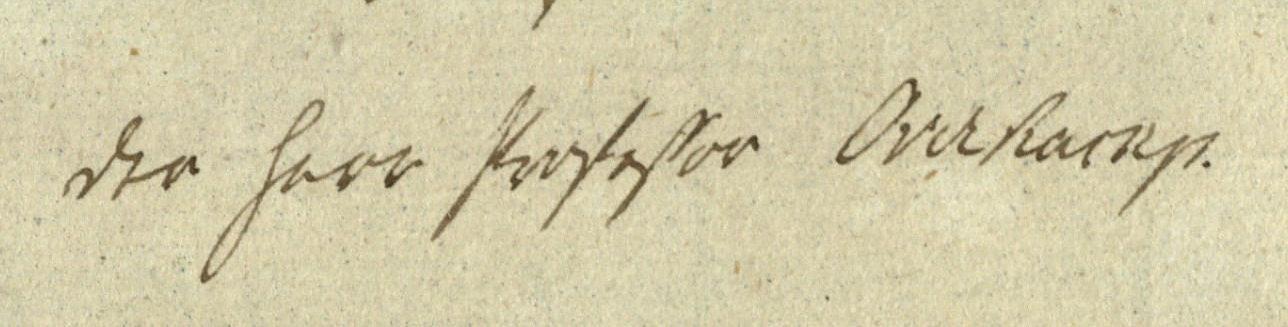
der Herr Professor Overkamp.
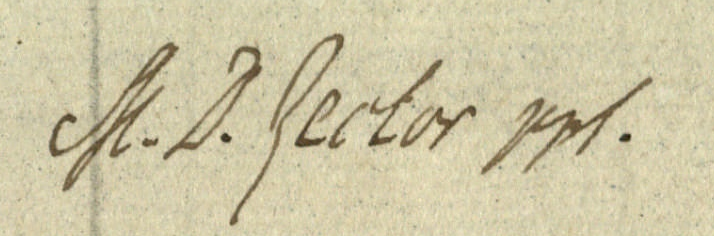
M. D. Rector ppt.
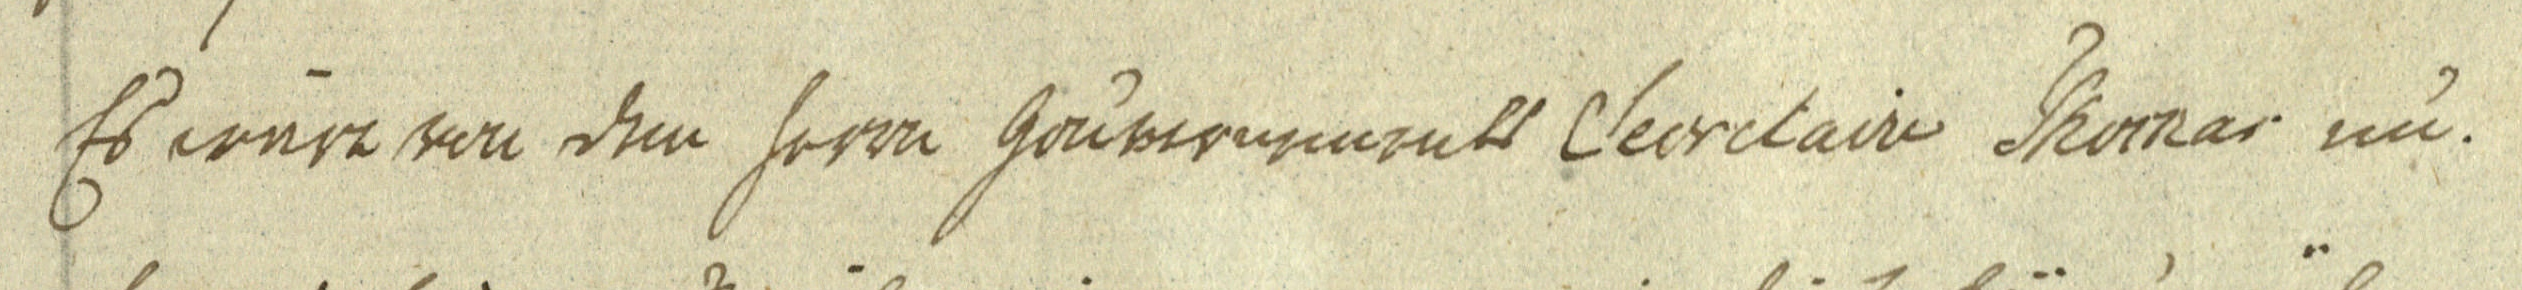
Es wäre von dem Herrn Gouvernements Secretaire Thomas un¬
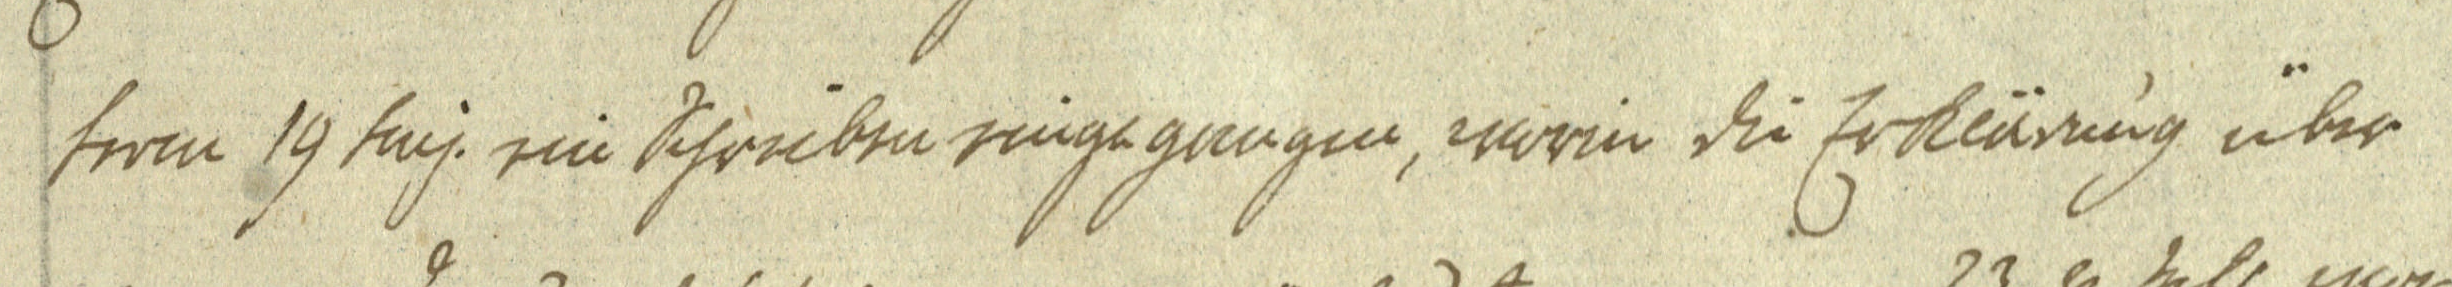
term 19 huj. ein Schreiben eingegangen, worin die Erklärung über
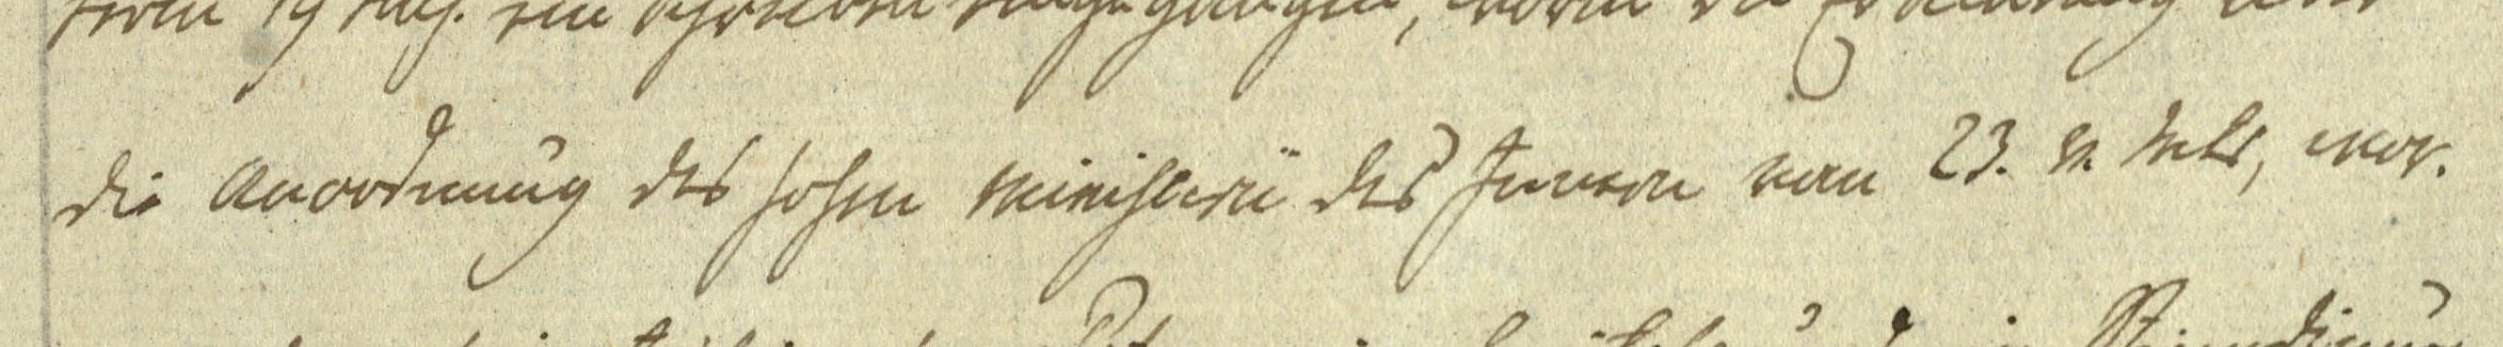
die Anordnung des hohen Ministerii des Innern vom 23. v. mts, wor¬
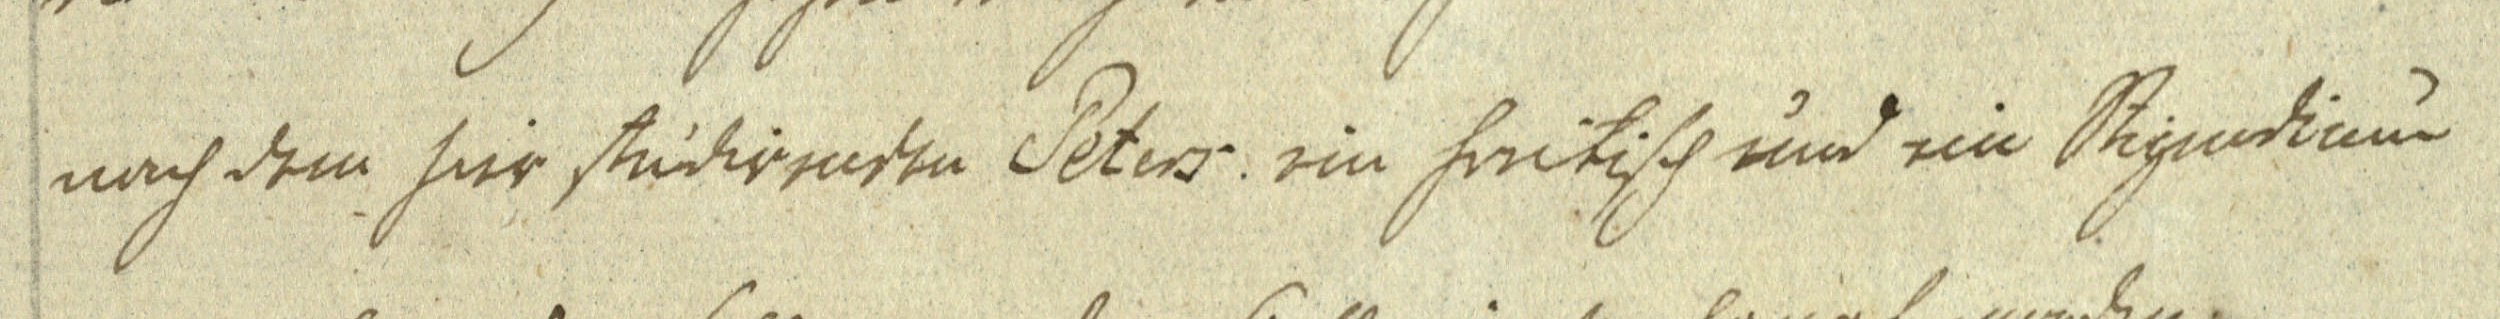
nach dem hier studirenden Peters ein Freitisch und ein Stipendium
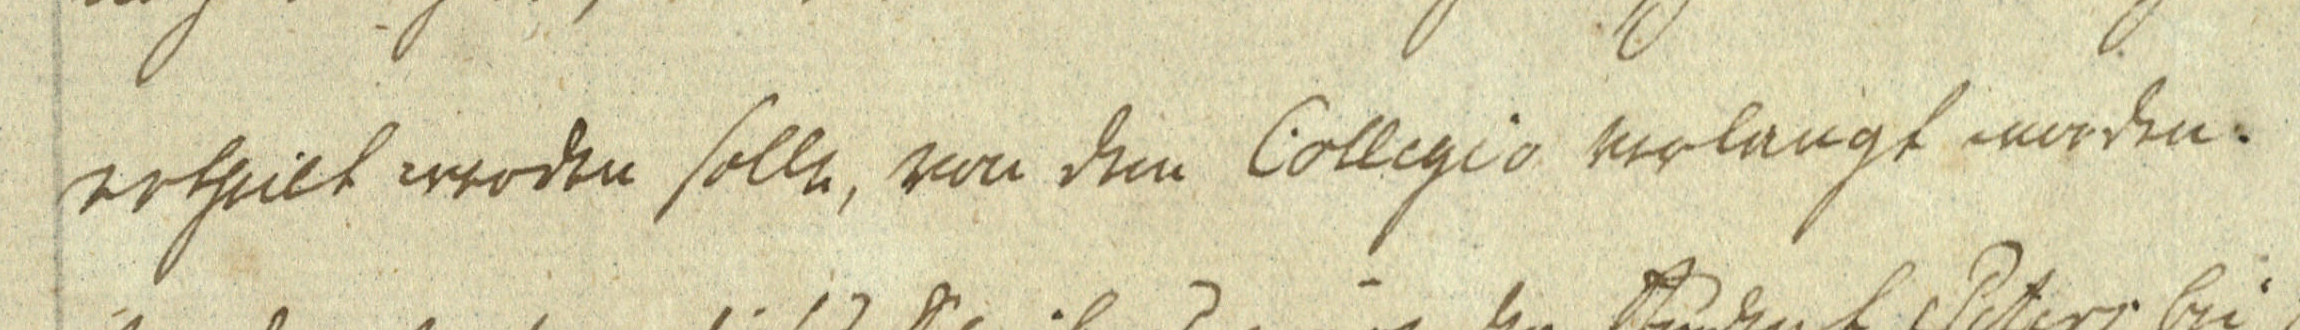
ertheilt werden solle, von dem Collegio verlangt worden.
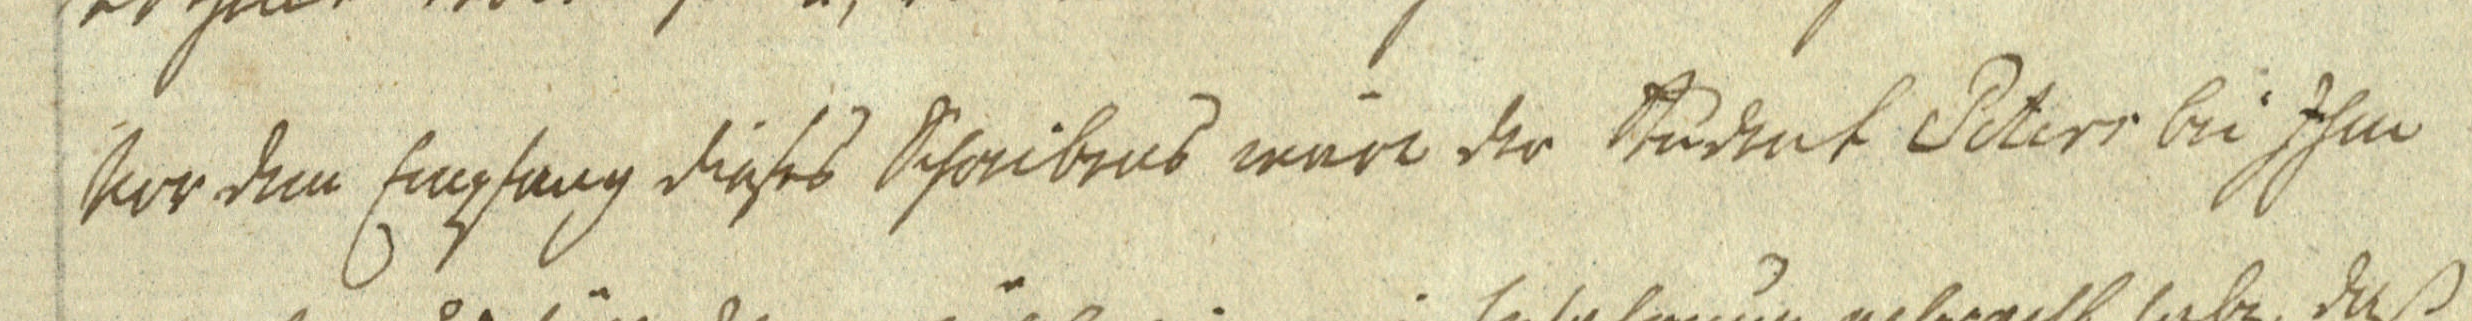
Vor dem Empfang dieses Schreibens wäre der Student Peters bei Ihm
